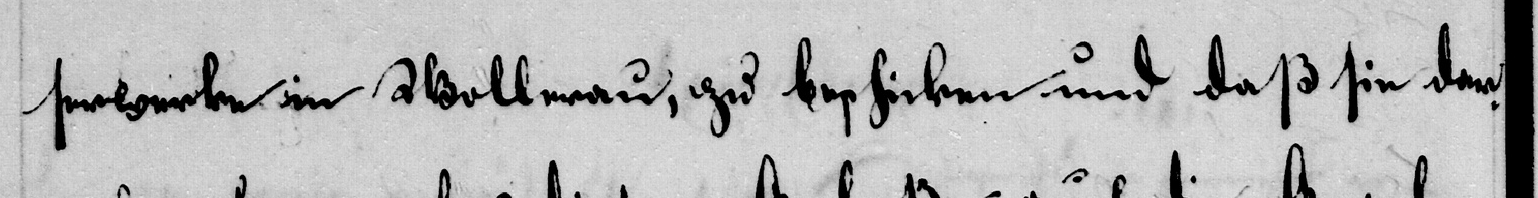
serwerke in Wollerau, zu beschicken und daß sie dar¬
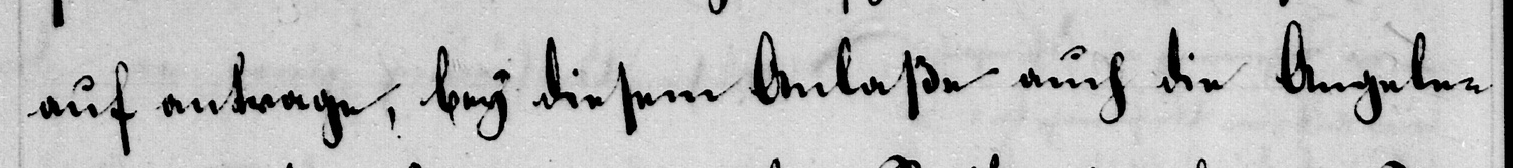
auf antrage, bey diesem Anlaße auch die Angele¬
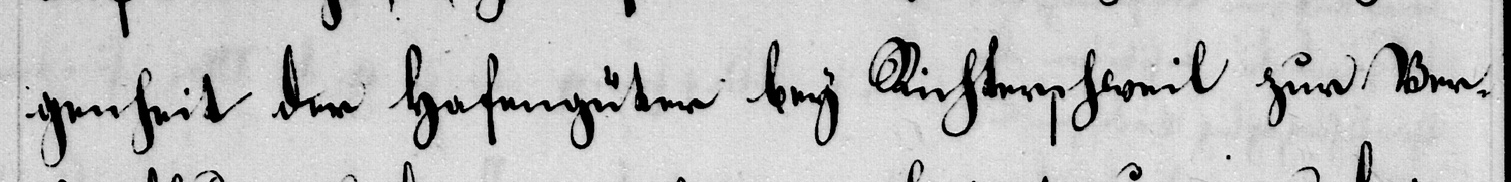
genheit der Hafengüter bey Richterschweil zur Ver¬
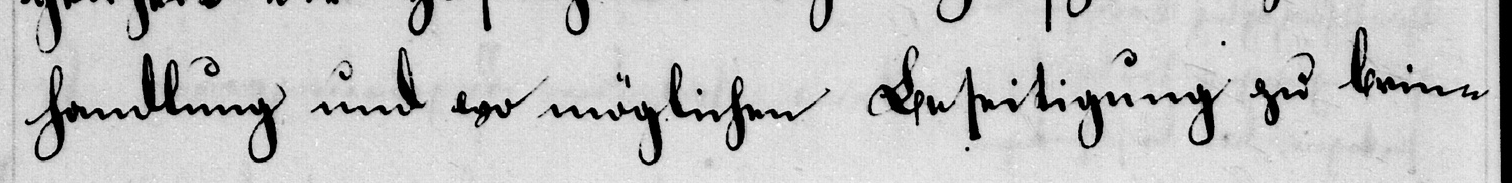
handlung und wo möglichen Beseitigung zu brin¬
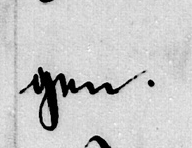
gen.
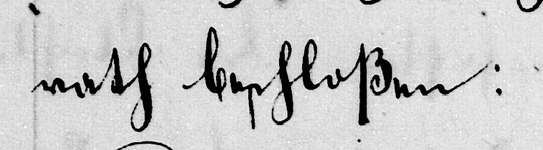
rath beschloßen:
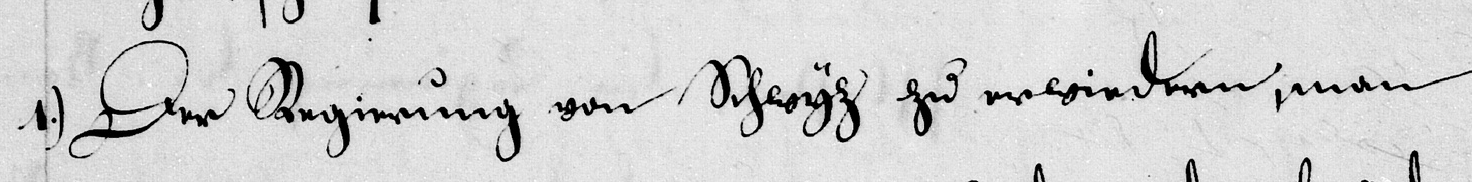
1.) Der Regierung von Schwyz zu erwiedern, man
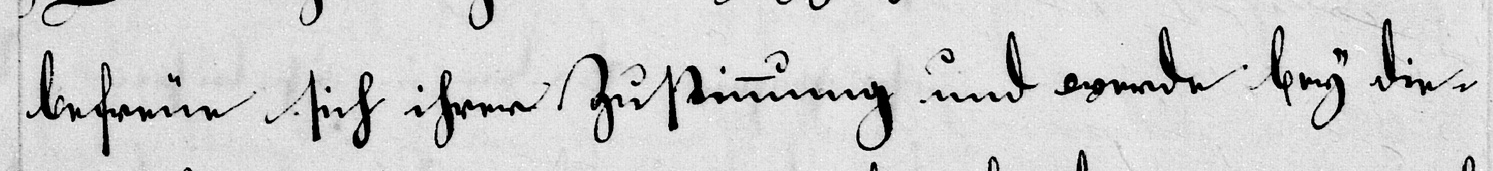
befreue sich ihrer Zustimmung und werde bey die¬
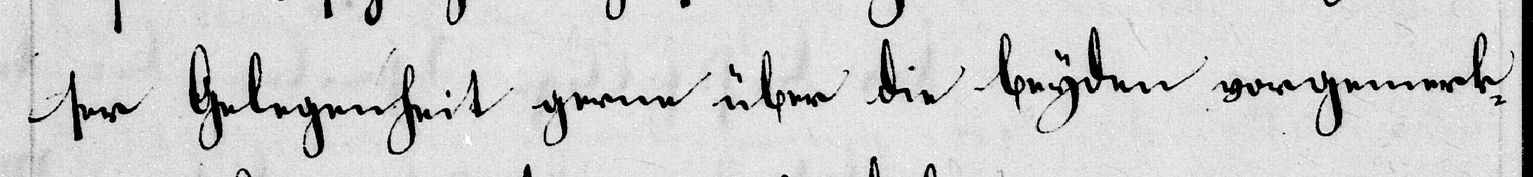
ser Gelegenheit gerne über die beyden vorgemerk¬
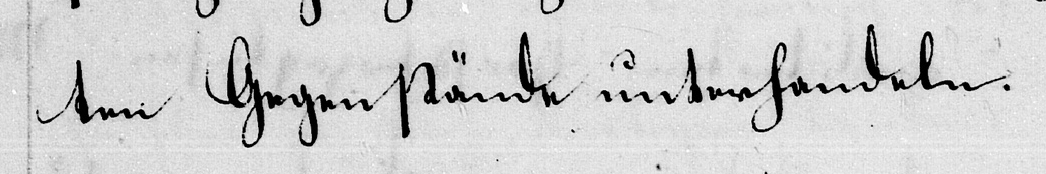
ten Gegenstände unterhandeln.
